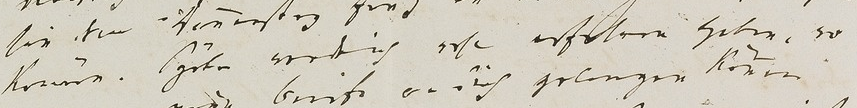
können. Später werde ich wohl erfahren haben, wo
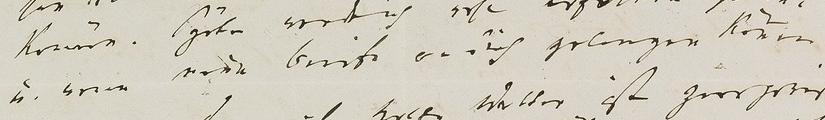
u. wann meine Briefe an dich gelangen können.
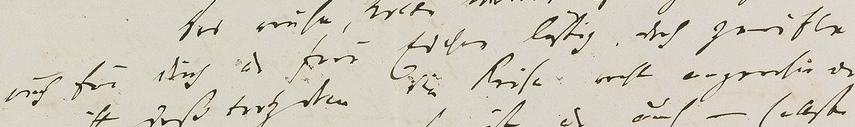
auch für dich u. Frau Escher lästig, doch zweifle
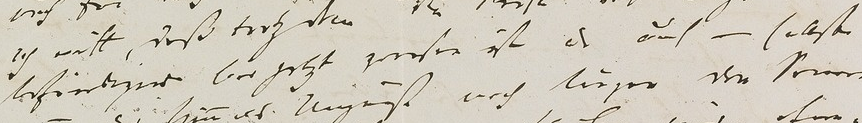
befriedigend bis jetzt gewesen ist u. auch – selbst
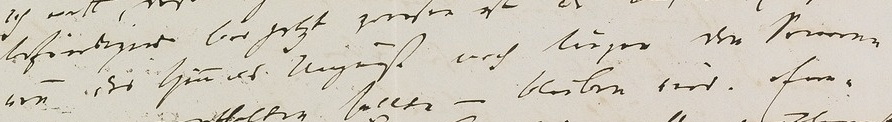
wenn des Himmels Ungunst noch länger den Sonnen-
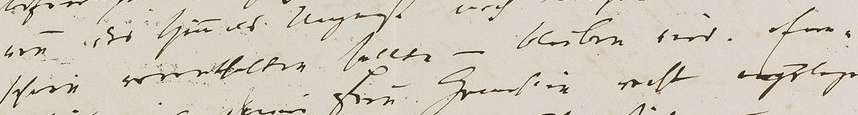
schein vorenthalten sollte – bleiben wird. Em-
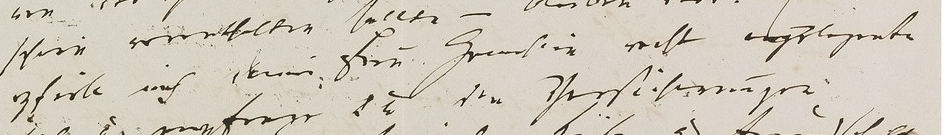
pfiehl mich deiner Frau Gemahlin recht angelegent-
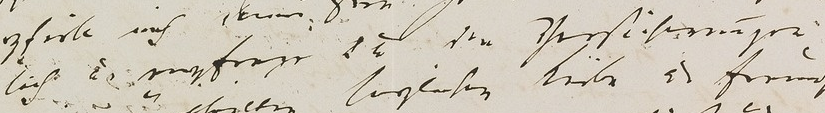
lich u.empfange Du die Versicherungen
